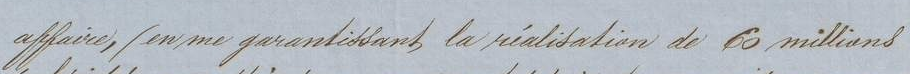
affaire, (en me garantissant la réalisation de 60 millions
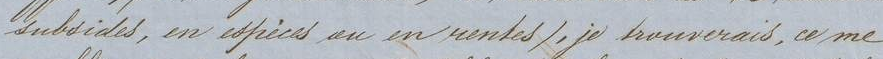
subsides, en espèces ou en rentes), je trouverais, ce me
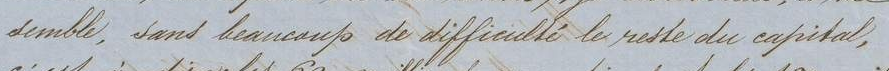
semble, sans beaucoup de difficulté le reste du capital,
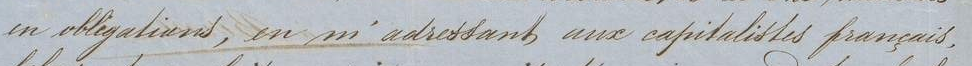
en obligations, en m'adressant aux capitalistes français,
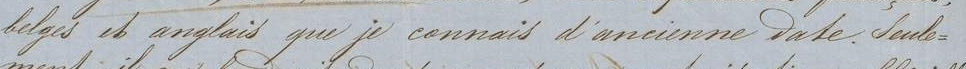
belges et anglais que je connais d'ancienne date. Seule-
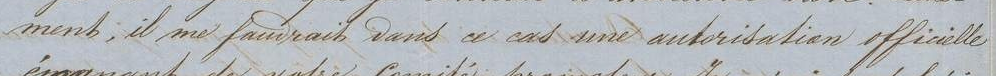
ment, il me faudrait dans ce cas une autorisation officielle
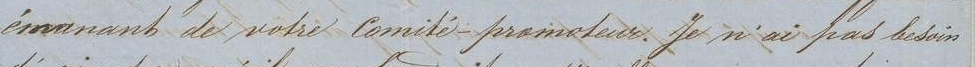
émanant de votre Comité-promoteur. Je n'ai pas besoin
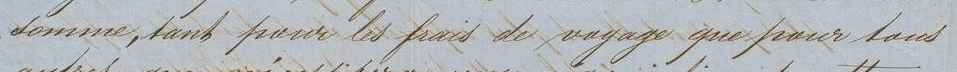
somme, tant pour les frais de voyage que que pour tous
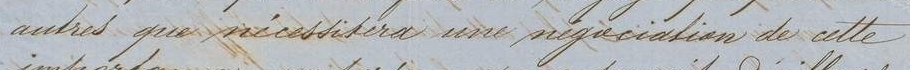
autres que nécessitera une négociation de cette
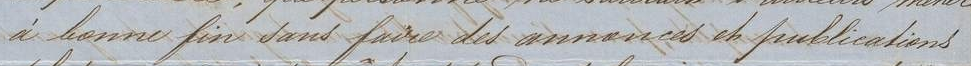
à bonne fin sans faire des annonces et publications
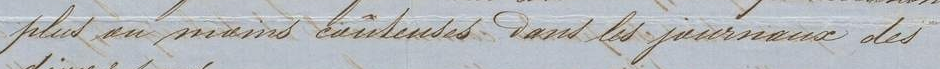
plus ou moins coûteuses dans les journaux des
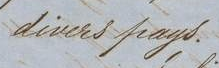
divers pays.
